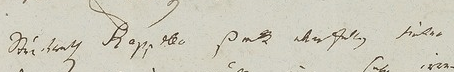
Ständerath Kappeler steckt ebenfalls hinter
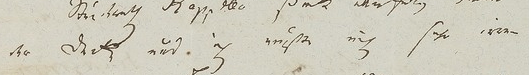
der Decke und ich müßte mich sehr irren,
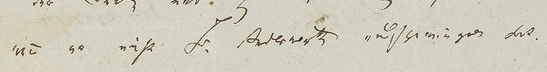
wenn er nicht Hr. Anderwerth aufgewiegelt hat.
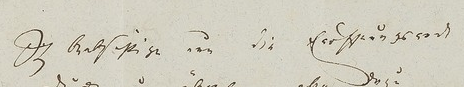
Ich beabsichtige nun die Eröffnungsrede
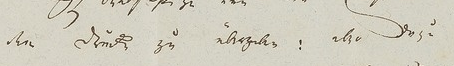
dem Drucke zu übergeben: aber dazu
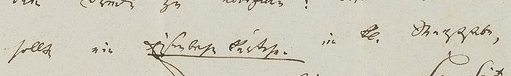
sollte ein Eisenbahnkärtchen in kl. Maaßstabe,
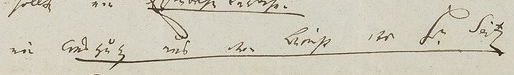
ein Auszug aus dem Bericht des HrSeitz
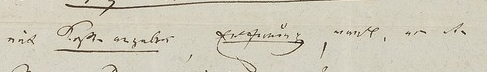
mit Kostenangaben, Entfernung, eventl. an den
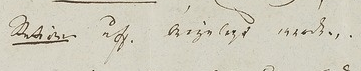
Stationen usf. beigelegt werden.
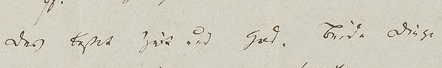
Das kostet Zeit und Geld. Beide Dinge
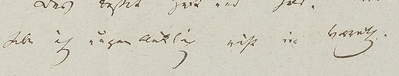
habe ich augenblicklich nicht im Vorrath.
